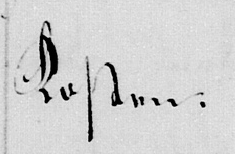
Kosten.
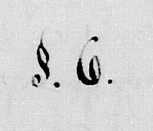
§. 6.
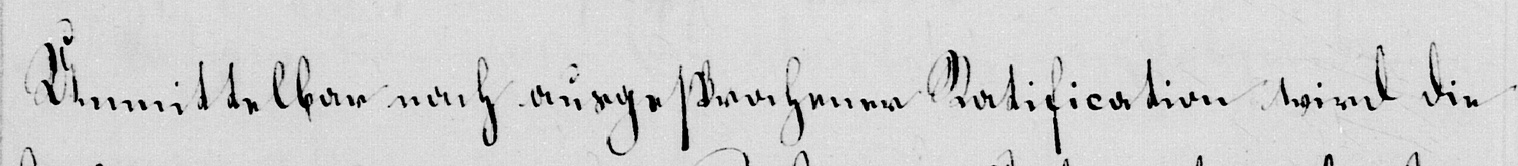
Unmittelbar nach ausgesprochener Ratification wird die
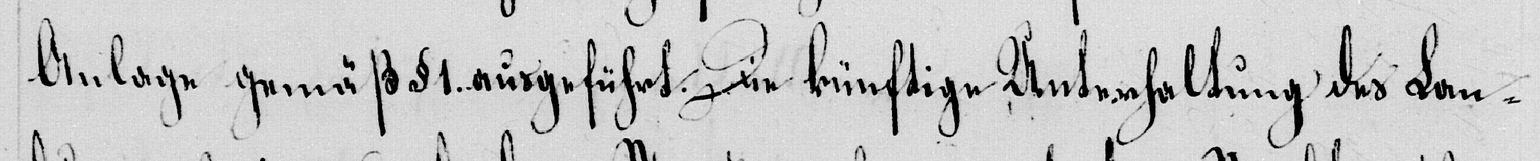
Anlage gemäß §. 1. ausgeführt. Die künftige Unterhaltung des Lan¬
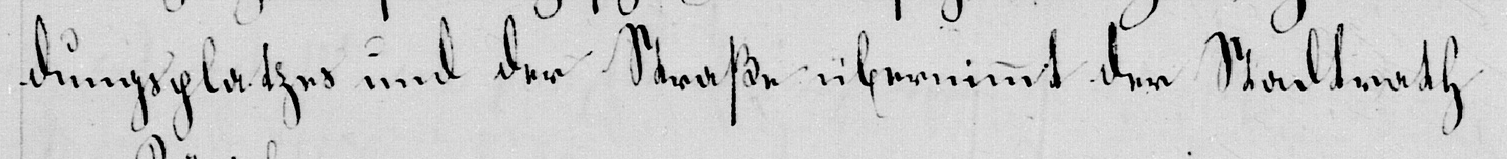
dungsplatzes und der Straße übernimmt der Stadtrath
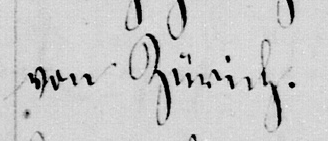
von Zürich.
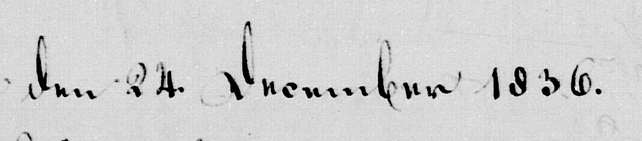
den 24. December 1836.
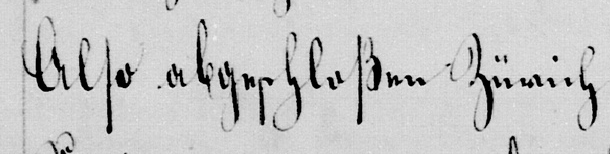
Also abgeschloßen Zürich
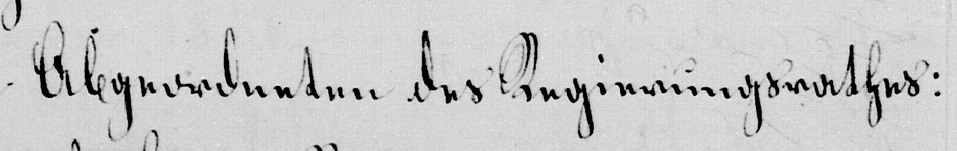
Abgeordneten des Regierungsrathes:
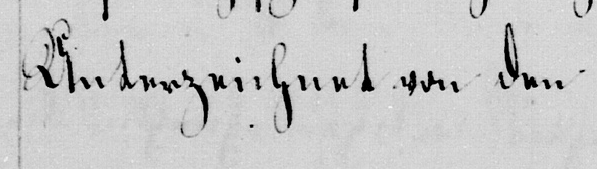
Unterzeichnet von den
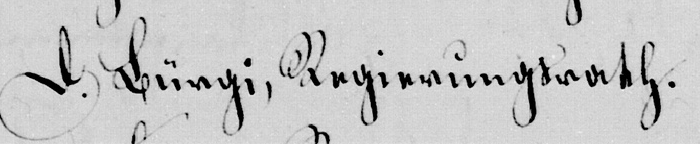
D. Bürgi, Regierungsrath.
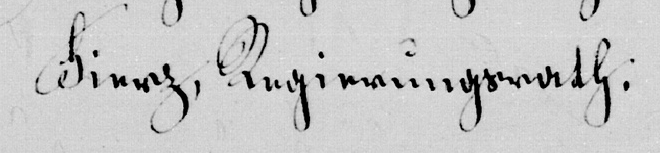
Fierz, Regierungsrath.
